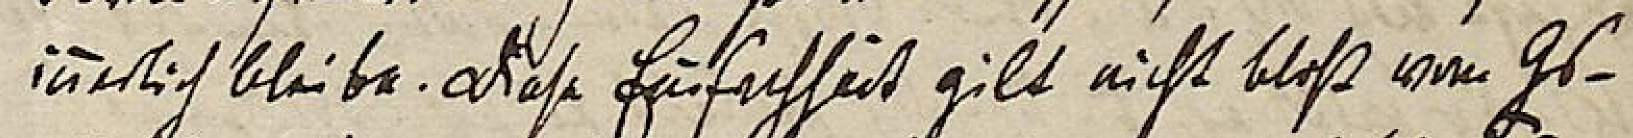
inerlich bleibe. Diese Einfachheit gilt nicht bloß vom Gs¬
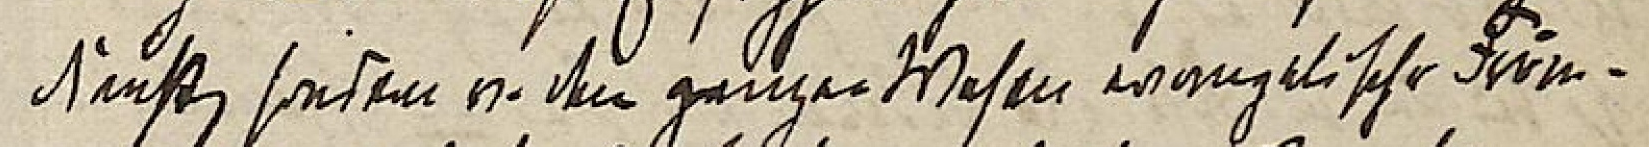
dienste, sondern v. dem ganzen Wesen evangelischer Fröm¬
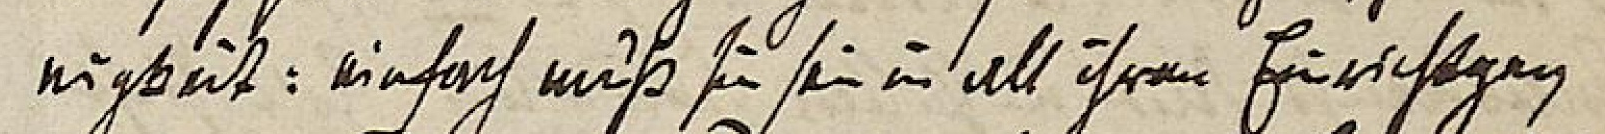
migkeit: einfach muß sie sein in all ihren Einrichtgen,
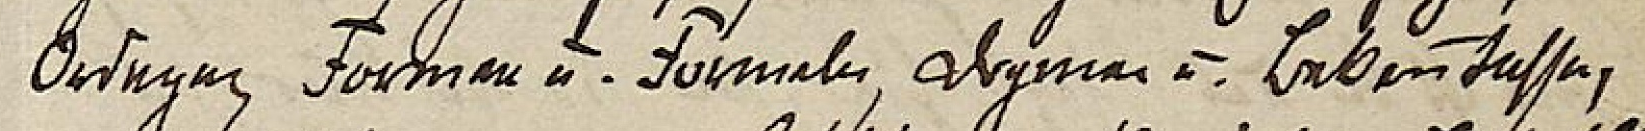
Ordngen, Formen u. Formeln, Domen u. Bekentnissen,
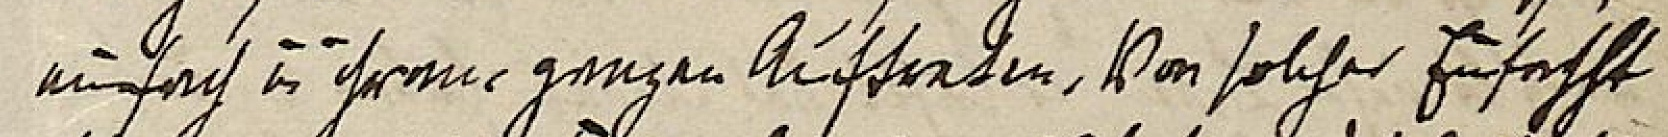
einfach in ihrem ganzen Auftreten. Von solcher Einfachht
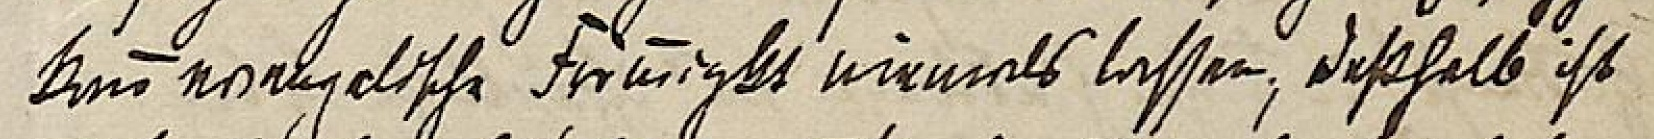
kan evangelische Frömigkt niemals lassen. Deßhalb ist
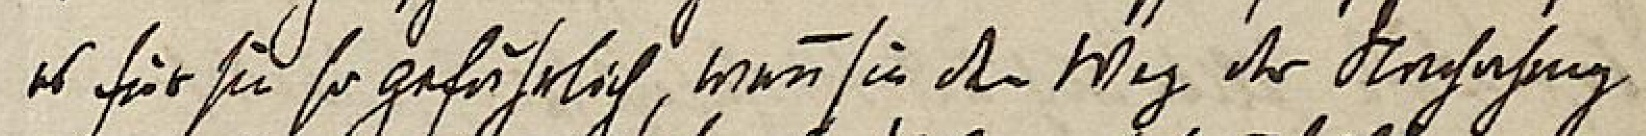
es für sie so geährlich, wen sie den Weg der Nachahmg
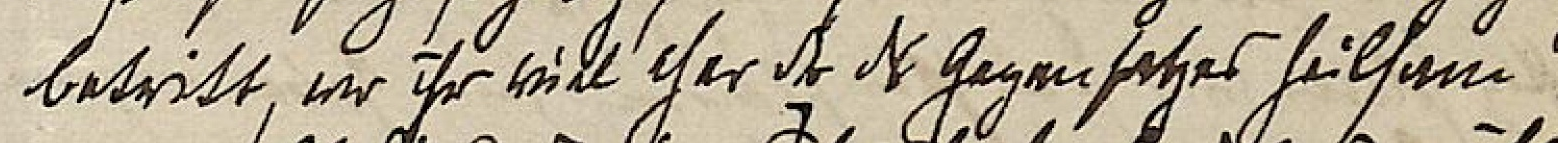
betritt, wo ihr viel eher dr ds Gegensatzes heilsam
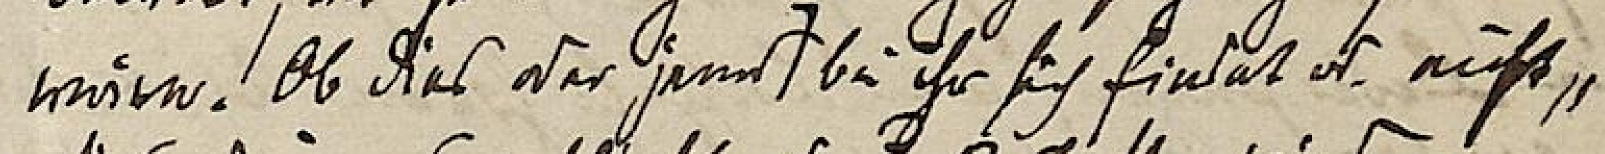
wäre! Ob dies oder jene ] bei ihr sich findet od. nicht,
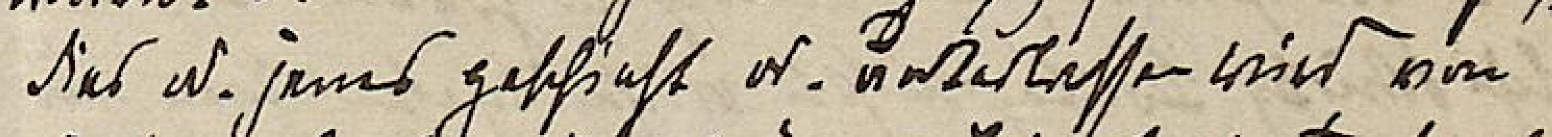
dies od. jenes geschieht od. unterlassen wird von
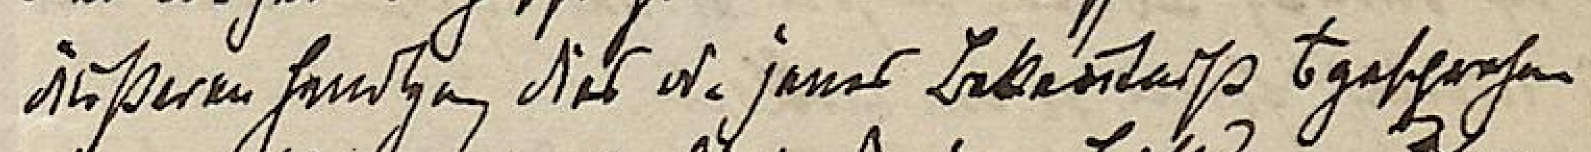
äußeren Handlgn, des od. jenes Bekentniß agesprochen
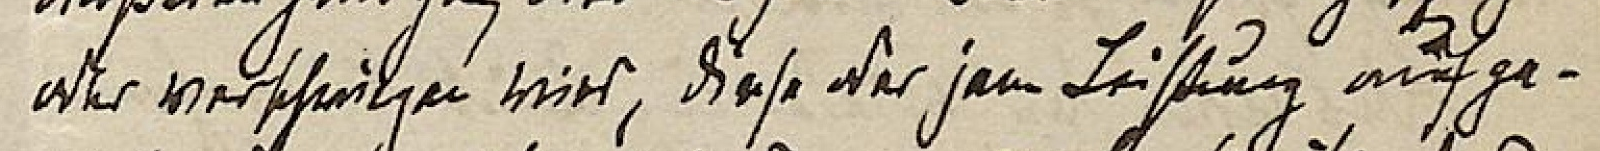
oder verschwiegen wird, diese oder jene Leistung aufge¬
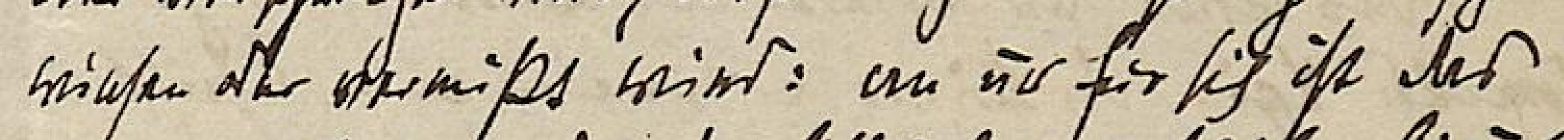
wiesen oder vermißt wird: an und für sich ist das
